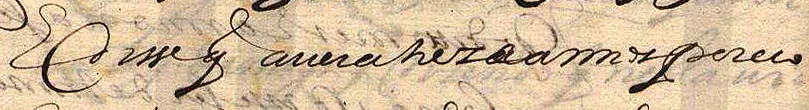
E disse q̄ auera treze annos pouco
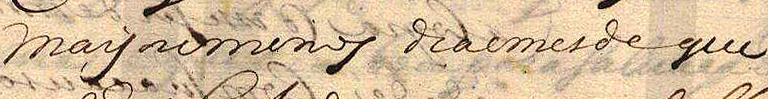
mais ou menos, dia e mes de que
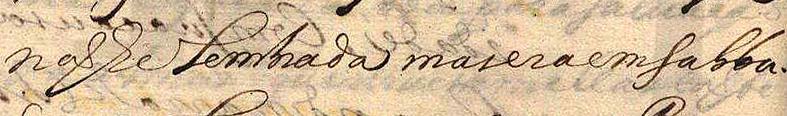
naõ he Lembrada mas era em sabba
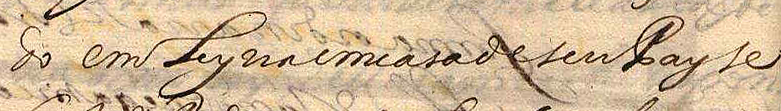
do em Leyria em casa de seu Pay se
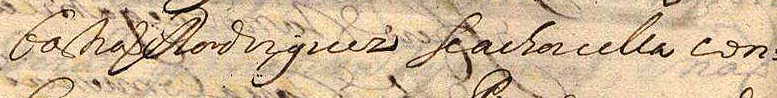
bastiaõ Rodriguez se achou ella con
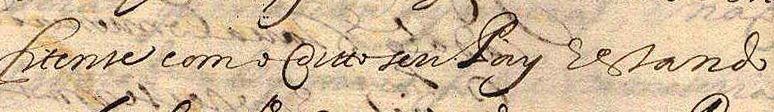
fitente com o ditto seu Pay E estando
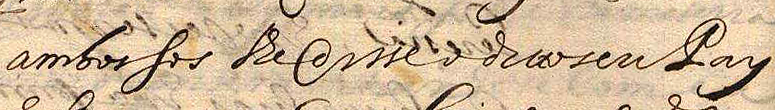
ambos sos lhe disse o ditto seu Pay
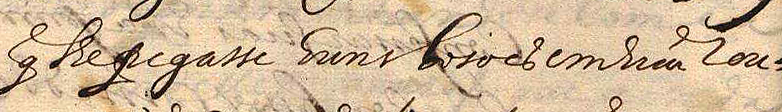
q̄ lhe pegasse huns botoes̄ em huā rou
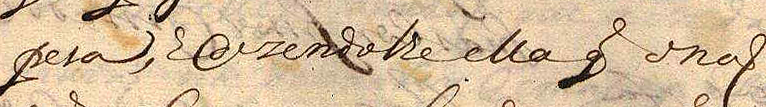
peta, E dizendolhe ella q̄ o naõ
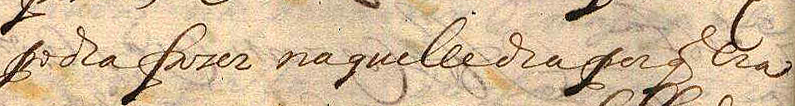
podia fazer naquelle dia porq̄ era
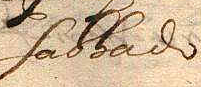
sabbado
